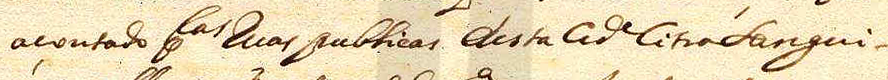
açoutado plas Ruas publicas desta Cide citra sangui
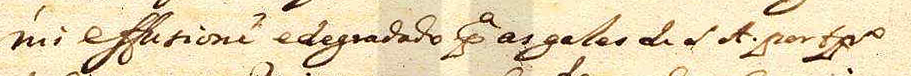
nis effusionē e degradado pa as gales de s A. por tpo
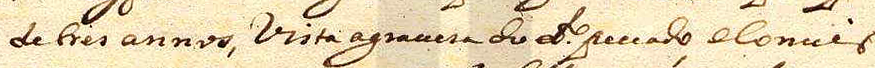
de tres annos, vista a graueza do d̄.o peccado, e conuir
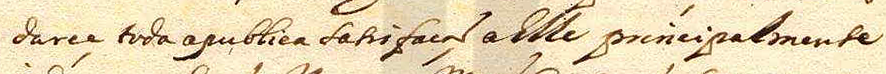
darce toda a publica satisfaçaõ a Elle principalmente
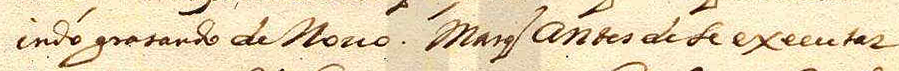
indo grasando de Nouo. Mas q̄ antes de se executar
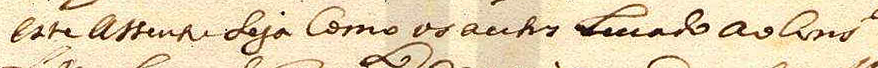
este assento seja Como os autos Leuado ao Conso
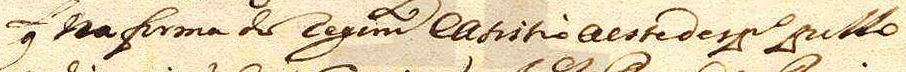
gl na forma do Regimto e asistio a este despo pello
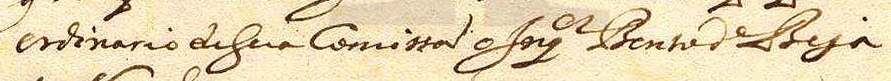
ordinario de sua Comissā o Jnqor Bento de Beja
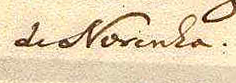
de Noronha.
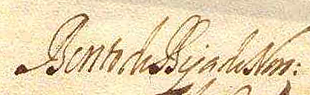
Bento de Beja de Noro
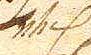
nha
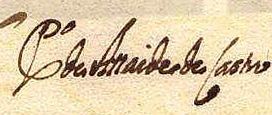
Po de Attaide de Castro
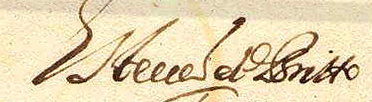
Esteuaõ de Britto
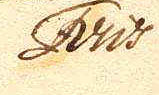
Foios
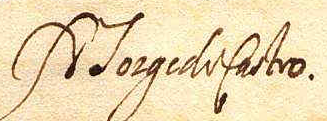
fr Iorge de Castro.
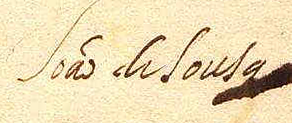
Ioão de Sousa
